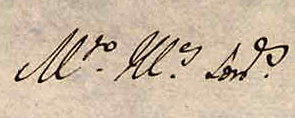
M.to Ill.es Sn.es
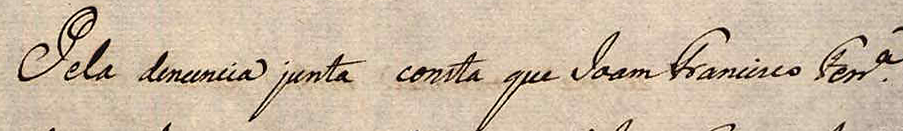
Pela denuncia junta consta que Ioam Francisco Ferr.a
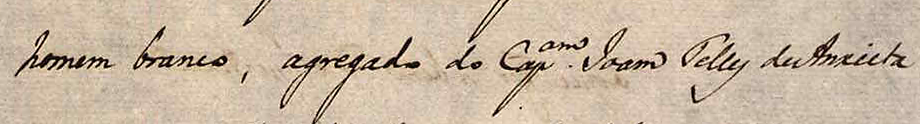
homem branco, agregado do Cap.am Ioam Telles de Anxieta
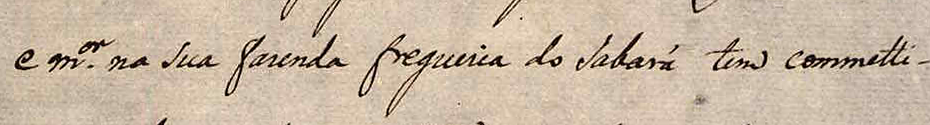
e m.or na sua fazenda freguezia do Sabará tem commetti
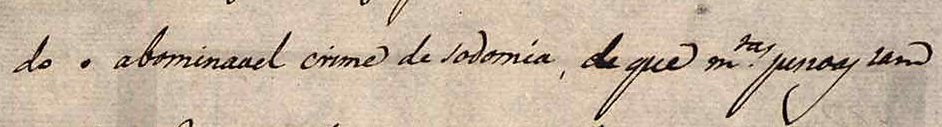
do o abominauel crime de sodomia, de que m.tas pessoas sam
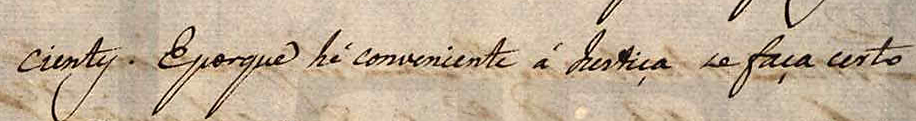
cientes: E porque hé conveniente á Iustiça se faça certo
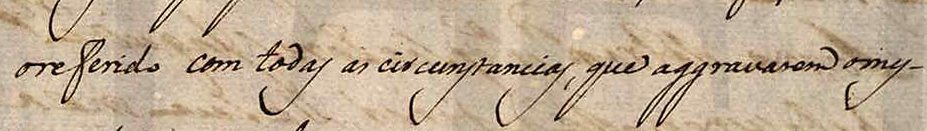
o referido com todas as circunstancias, que aggravarem o mes
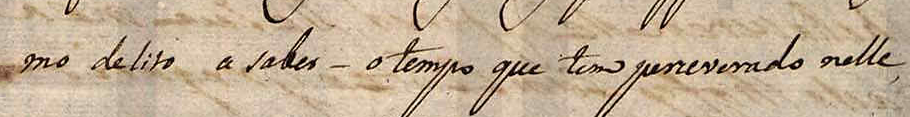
mo delito a saber - o tempo que tem perseverado nelle
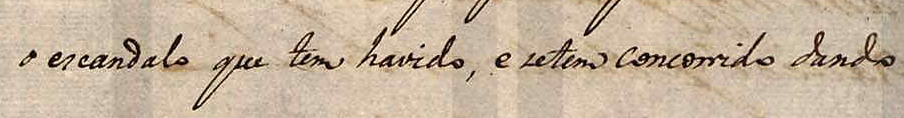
o escandalo que tem havido, e se tem concorrido dando
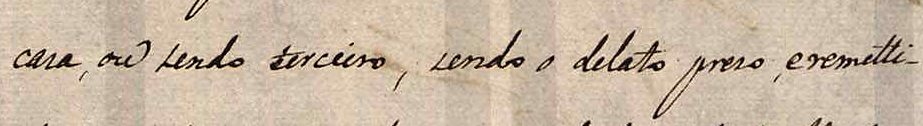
caza, ou sendo terceiro, sendo o delato prezo, e remetti
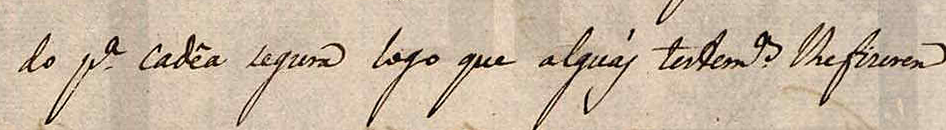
do p.a cadêa segura logo que alguās testem.as lhe fizeren
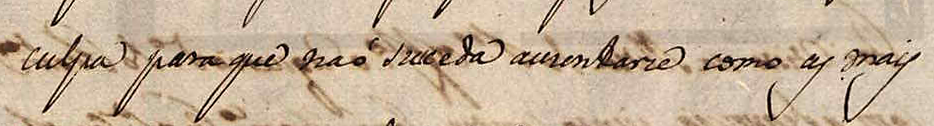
culpa o para que naõ succeda ausentarze como as mais
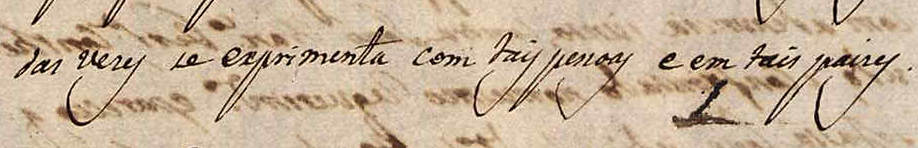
das vezes se exprimenta com tais pessoas e em tais paizes.
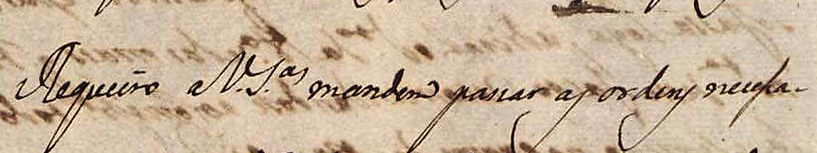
Requeiro a V. S.as mandem passar as ordens necessa
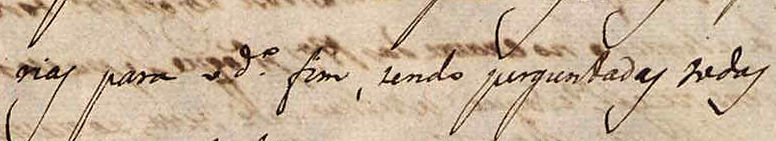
rias para o d.o fim, sendo perguntadas todas
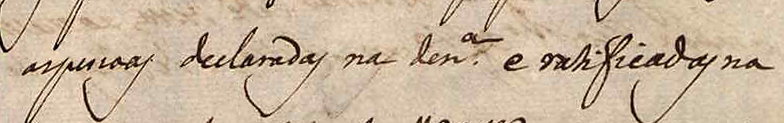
as pessoas declaradas na den.a e ratificadas na
